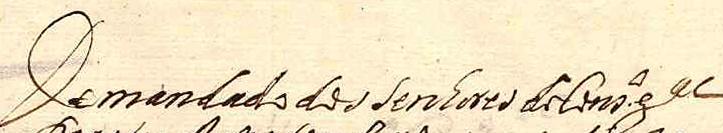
De mandado dos senhores do Cons.o gal
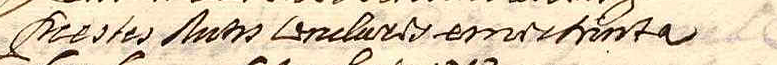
fiz estes Autos concluzos em os trinta
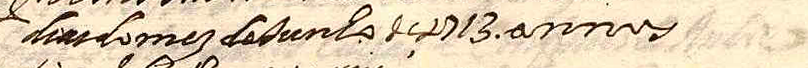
dias do mez de Iunho de 1713. annos
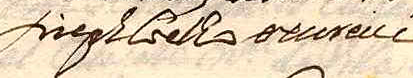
Jozeph Coelho o escreui
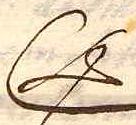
CLo
